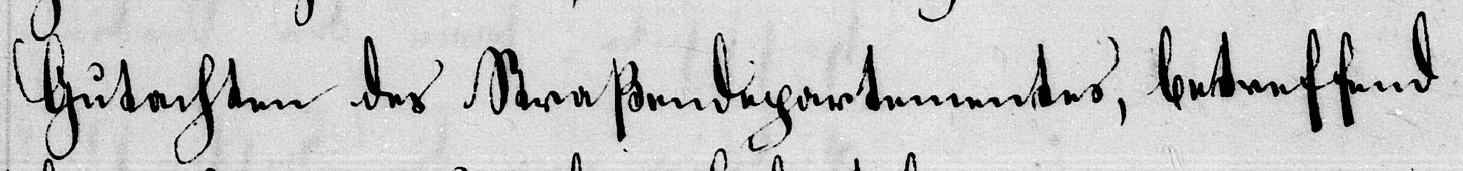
Gutachten des Straßendepartementes, betreffend
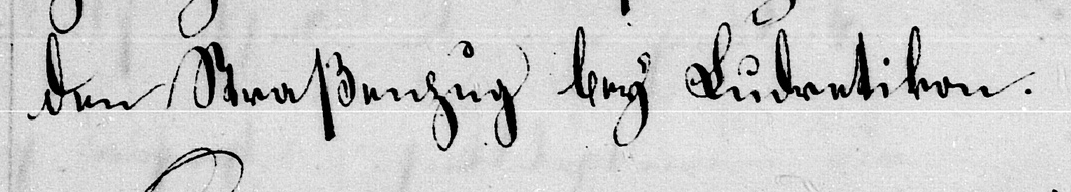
den Straßenzug bey Ludretikon.
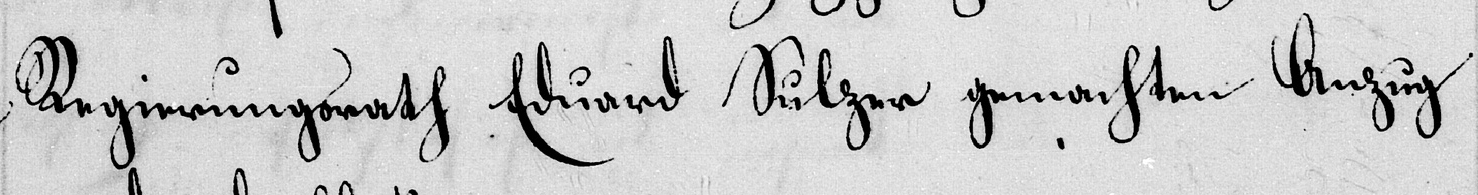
Regierungsrath Eduard Sulzer gemachten Anzug
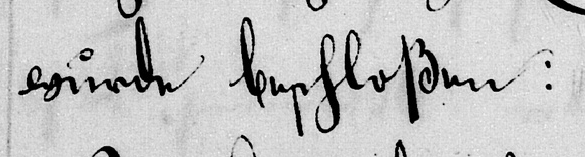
wurde beschloßen:
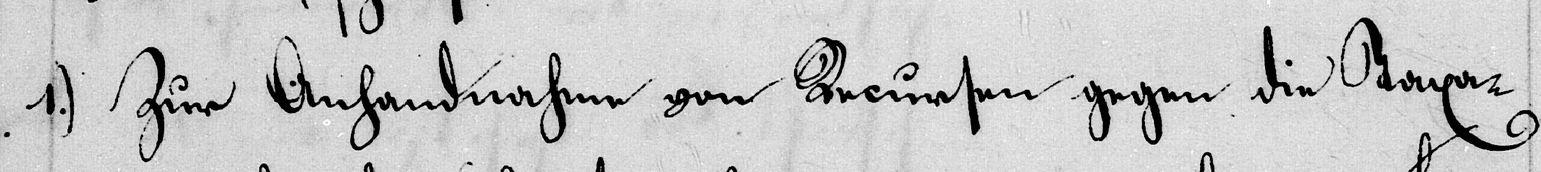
1.) Zur Anhandnahme von Recursen gegen die Taxa¬
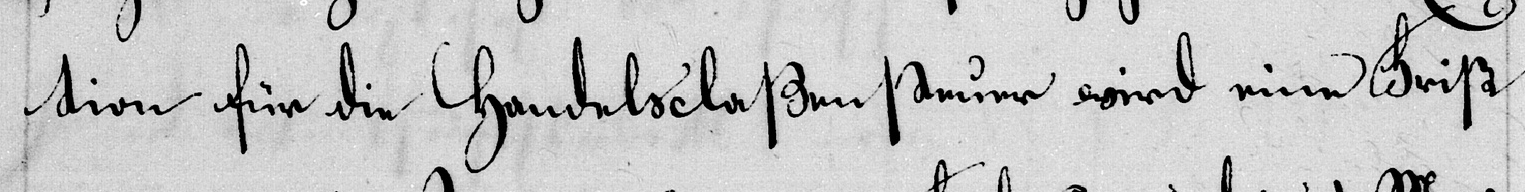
tion für die Handelsclaßensteuer wird eine Frist
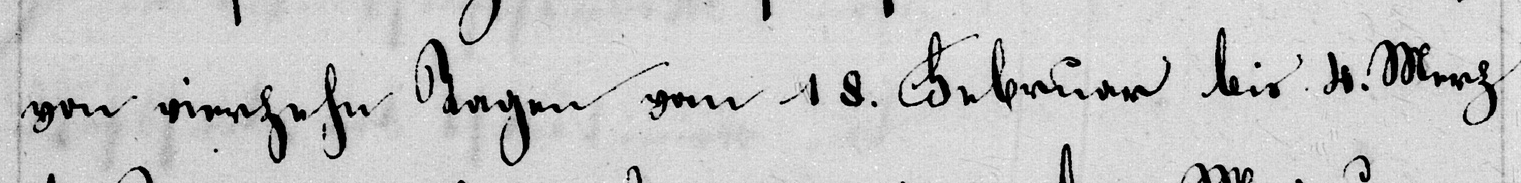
von vierzehn Tagen vom 18. Februar bis 4. März
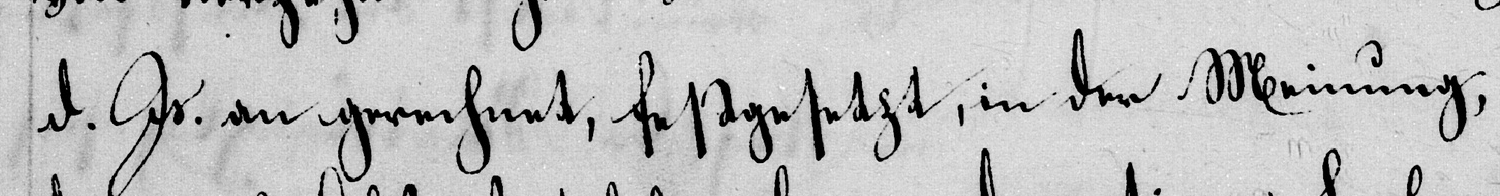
d. Js. an gerechnet, festgesetzt, in der Meinung,
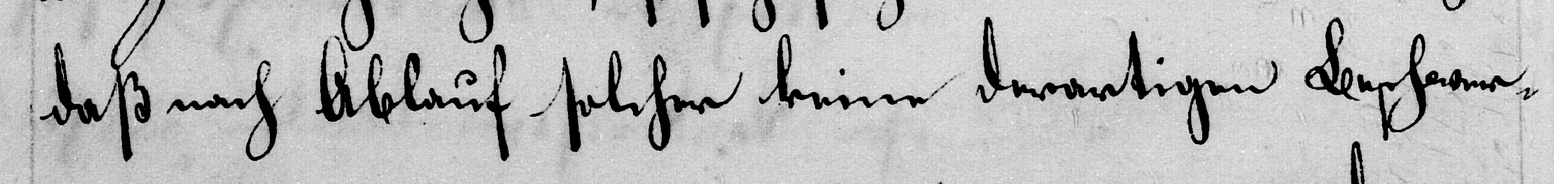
daß nach Ablauf solcher keine derartigen Beschwer-
